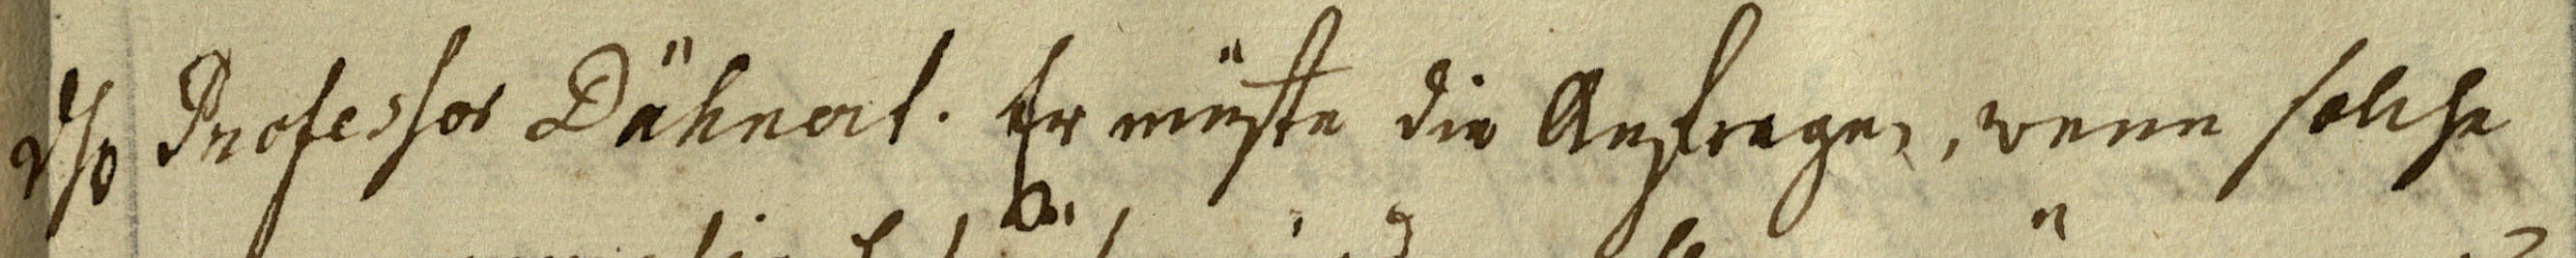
dh Professor Dähnert. Er müste die Anfrage, wenn solche
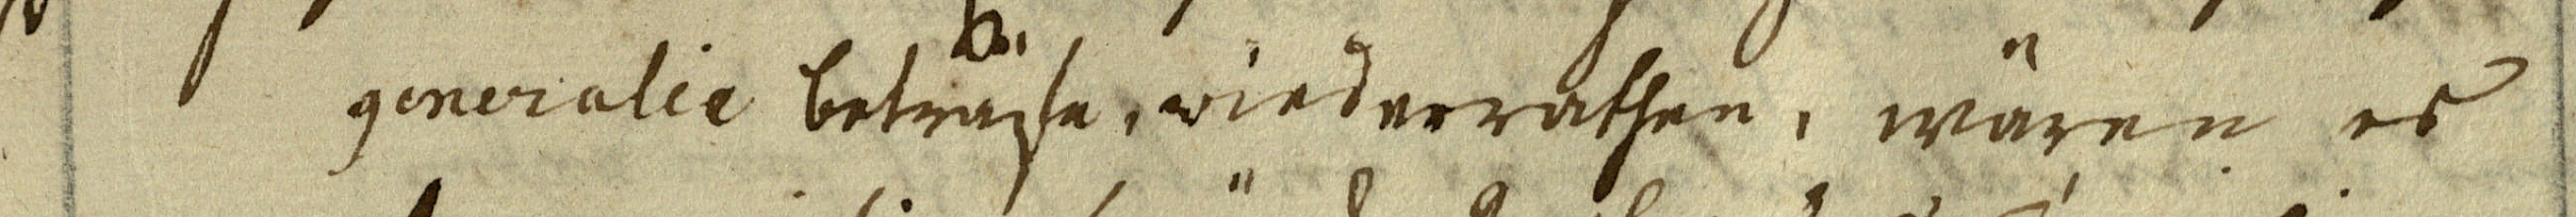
generalia beträfe, wiederrathen, wären es
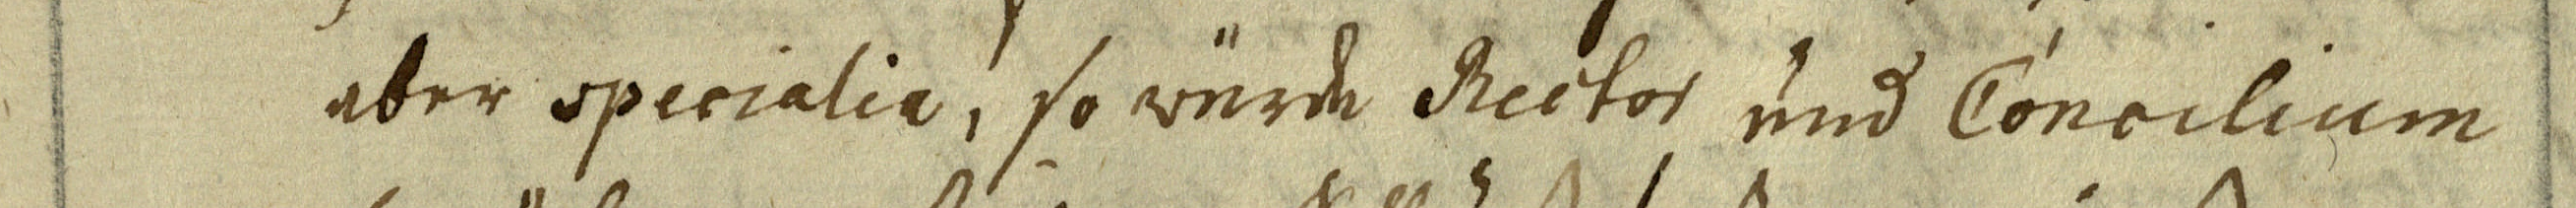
aber specialia, so würde Rector und Concilium
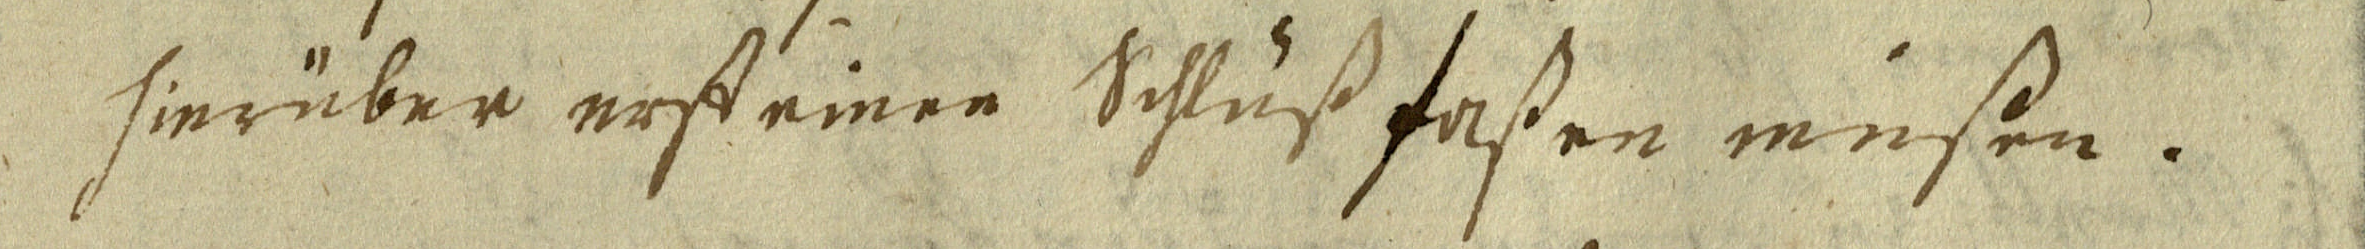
hierüber erst einen Schluß faßen müßen.
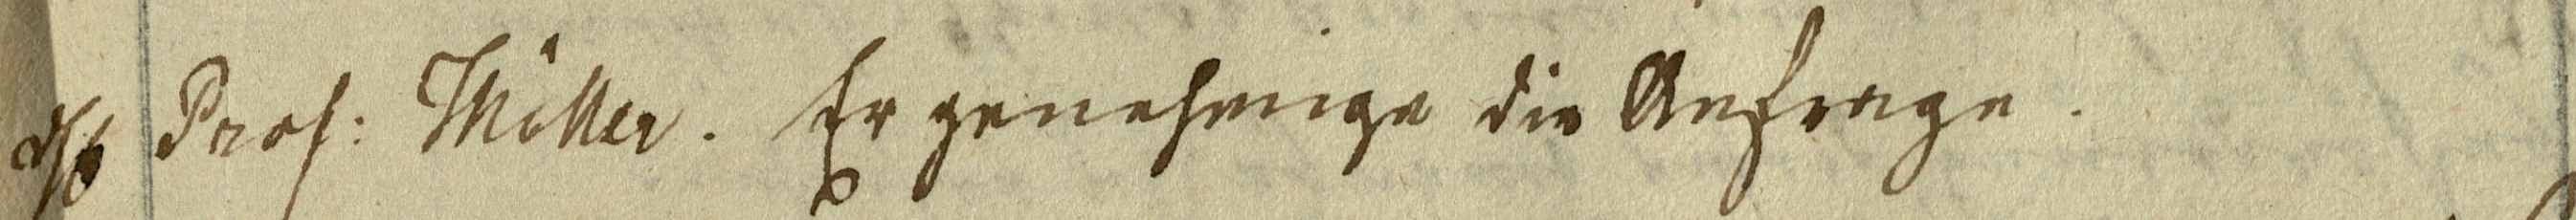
dh Prof. Möller. Er genehmige die Anfrage.
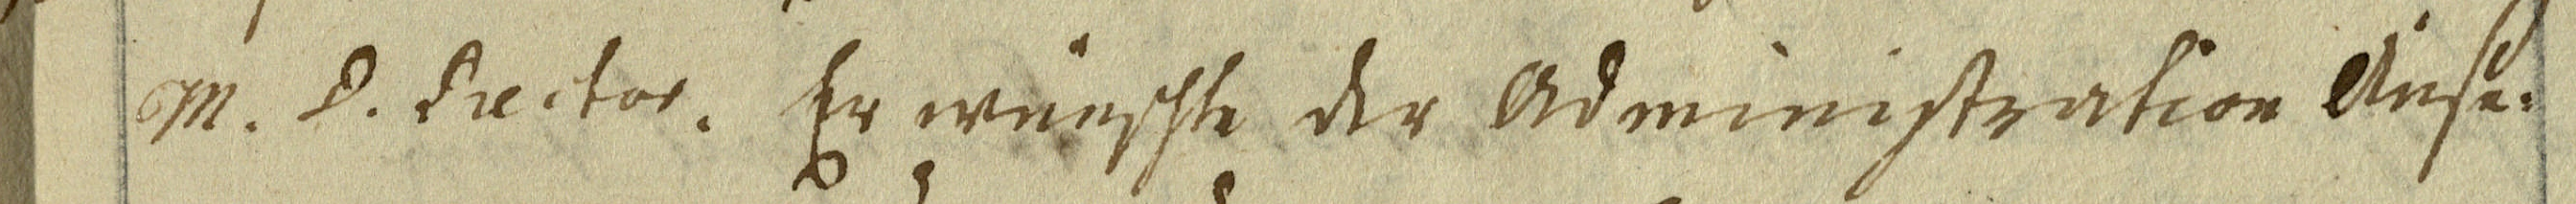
M. D. Rector. Er wünsche der Administration Äuße¬
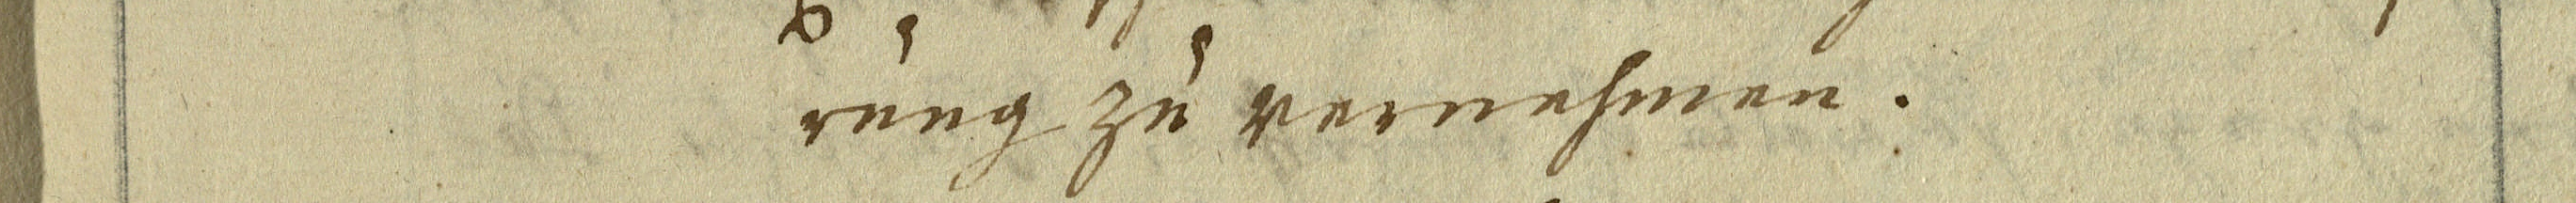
rung zu vernehmen.
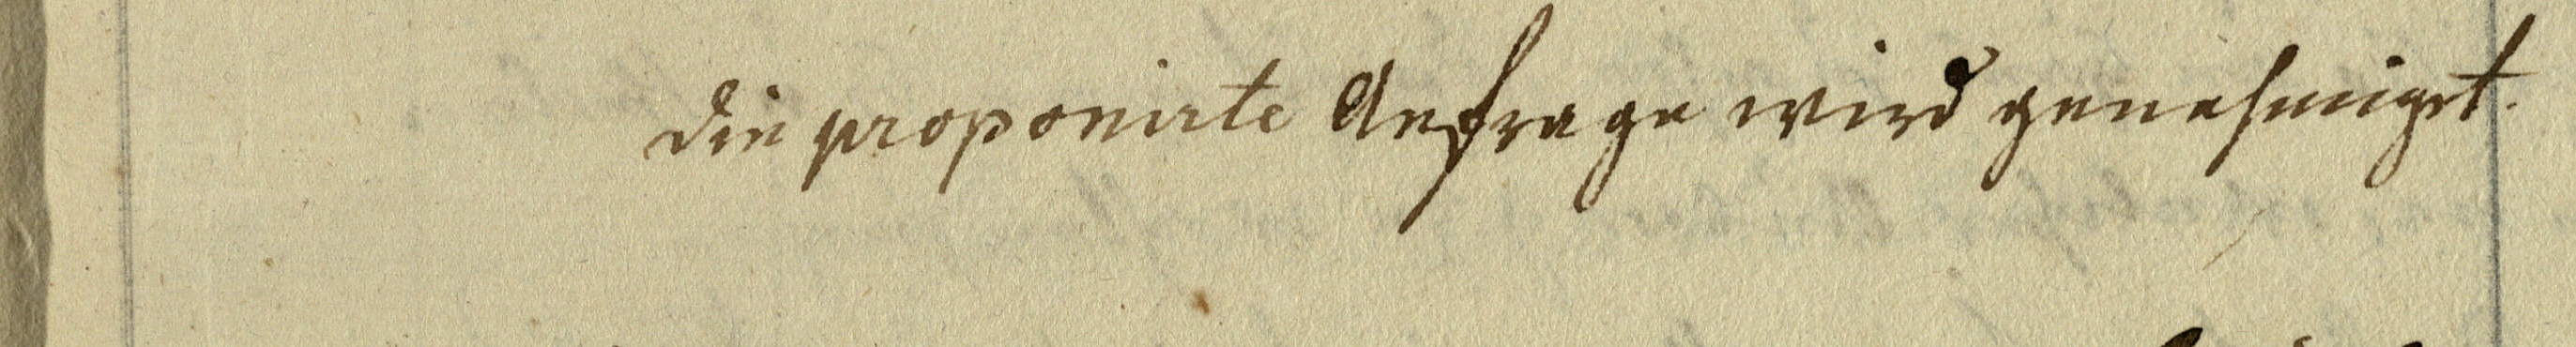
die proponirte Anfrage wird genehmiget.
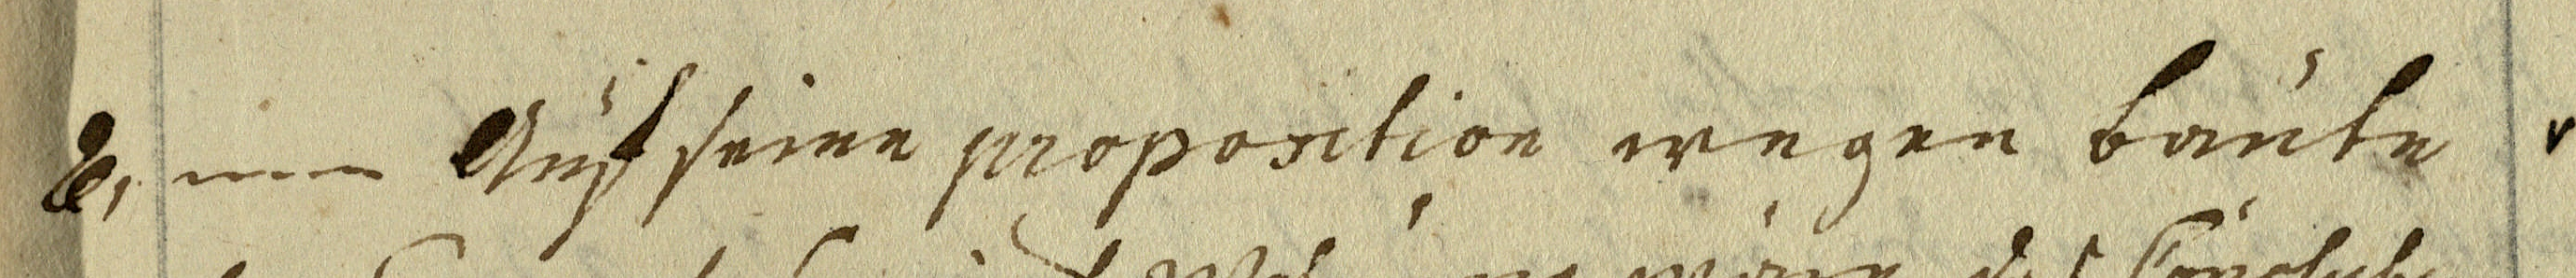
8. Auf seine proposition wegen Baute
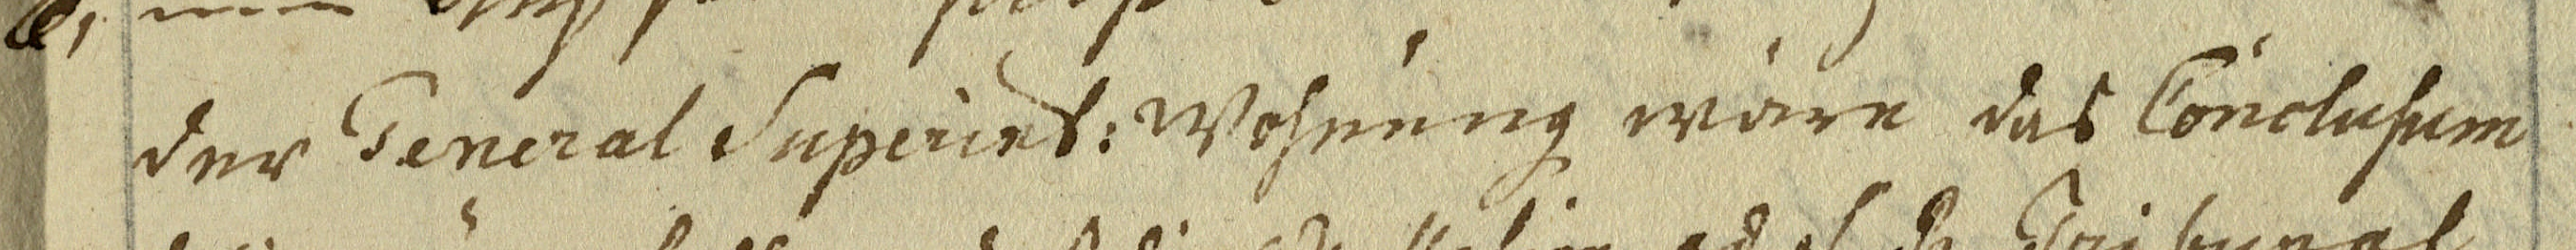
der GeneralSuperint. Wohnung wäre das Conclusum
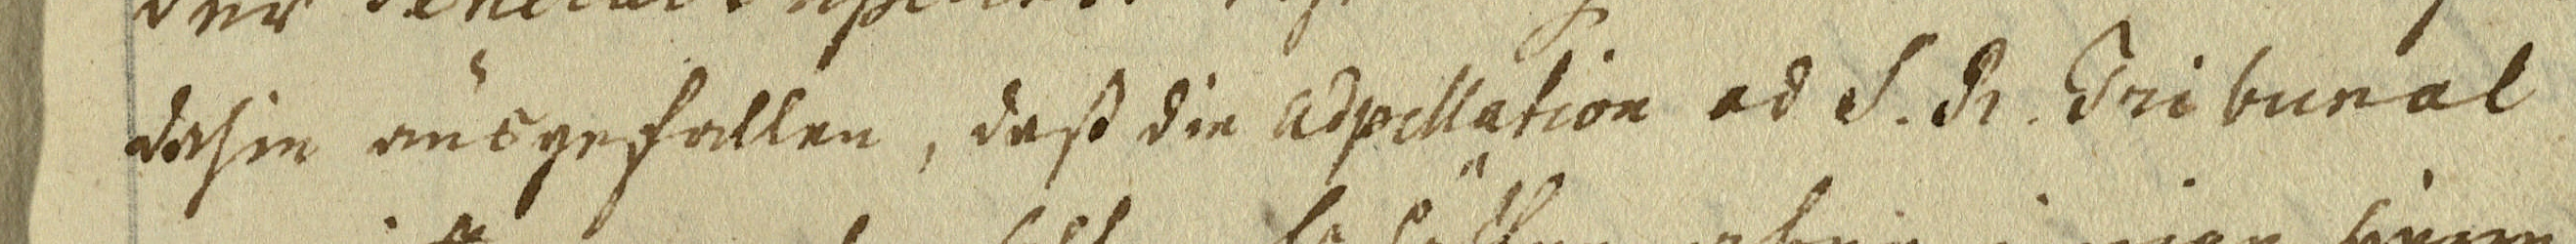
dahin ausgefallen, daß die Adpellation ad S. K. Tribunal
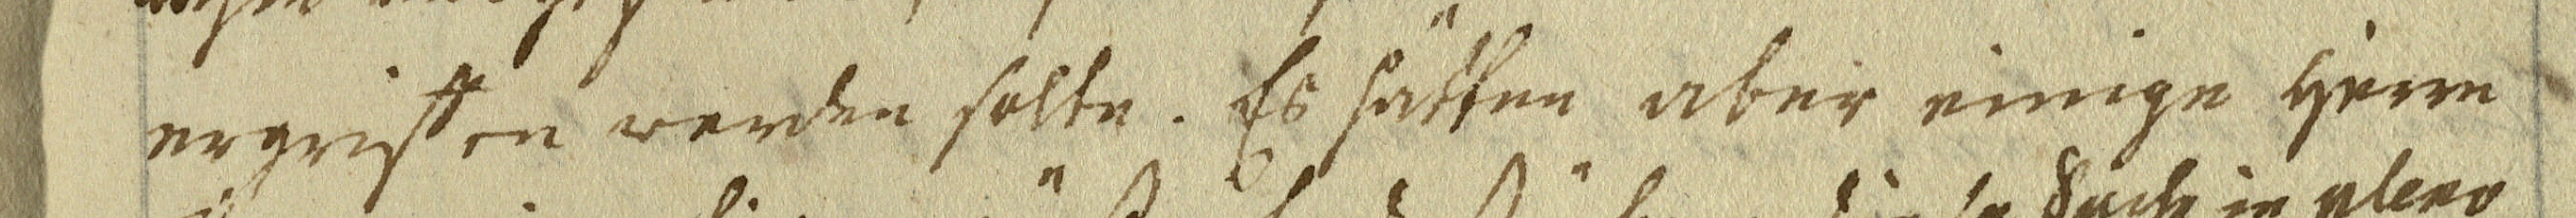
ergrifen werden solte. Es hätten aber einige Herrn
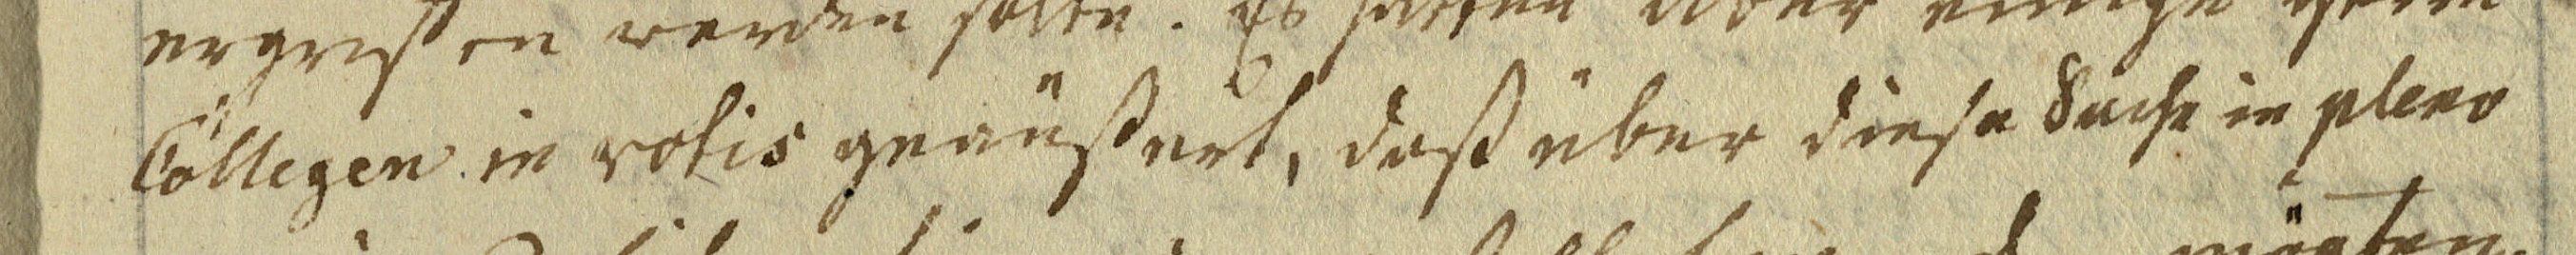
Collegen in votis geäußert, daß über diese Sache in pleno
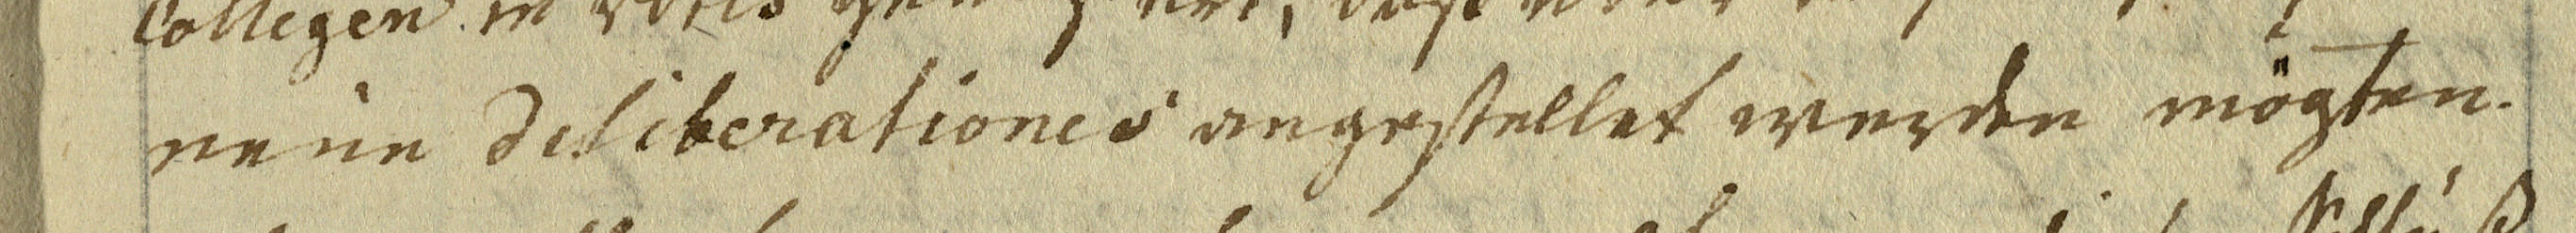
neue deliberationes angestellet werden mögten.
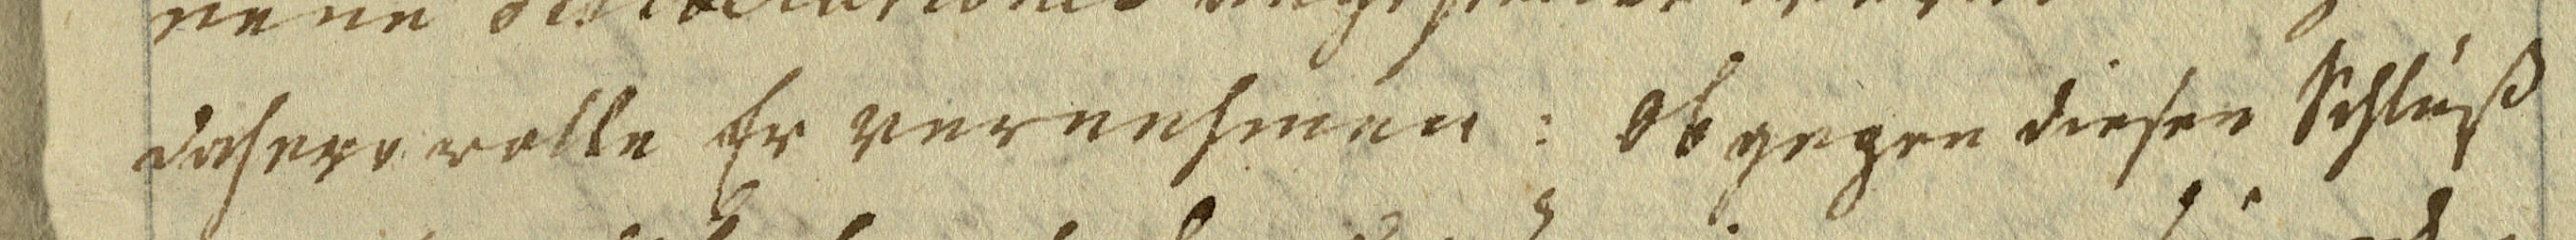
Dahero wolle Er vernehmen,: ob gegen diesen Schluß
